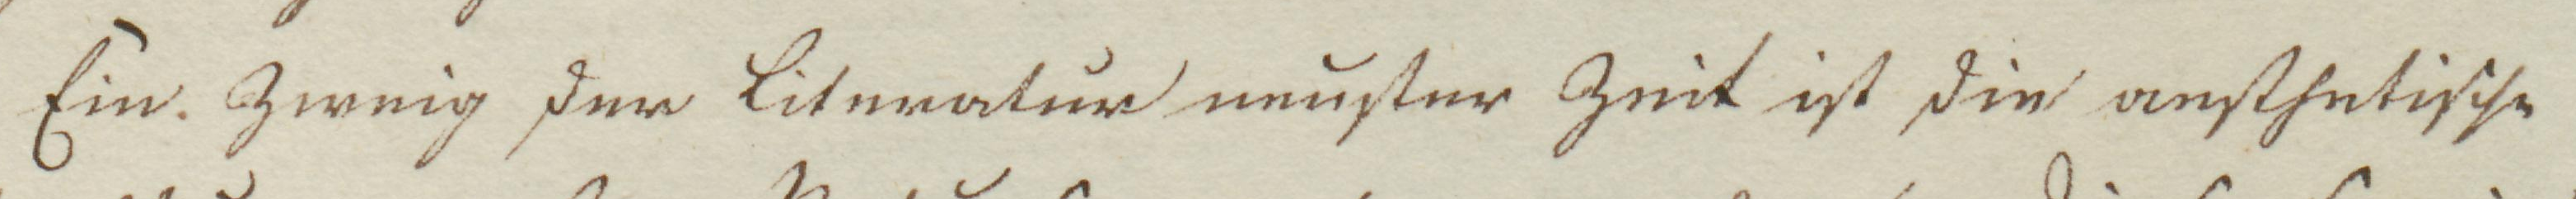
Ein Zweig der Literatur neuster Zeit ist die aesthetische
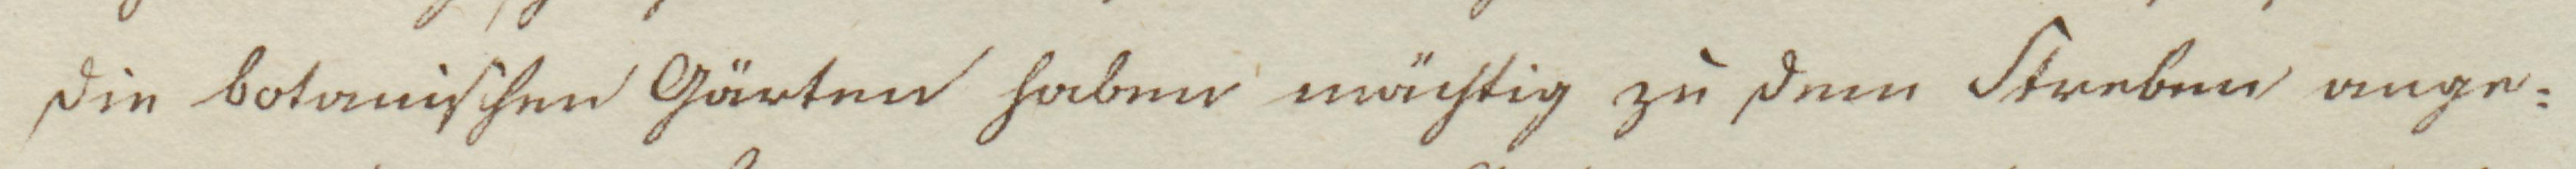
die botanischen Gärten haben mächtig zu dem Streben ange-
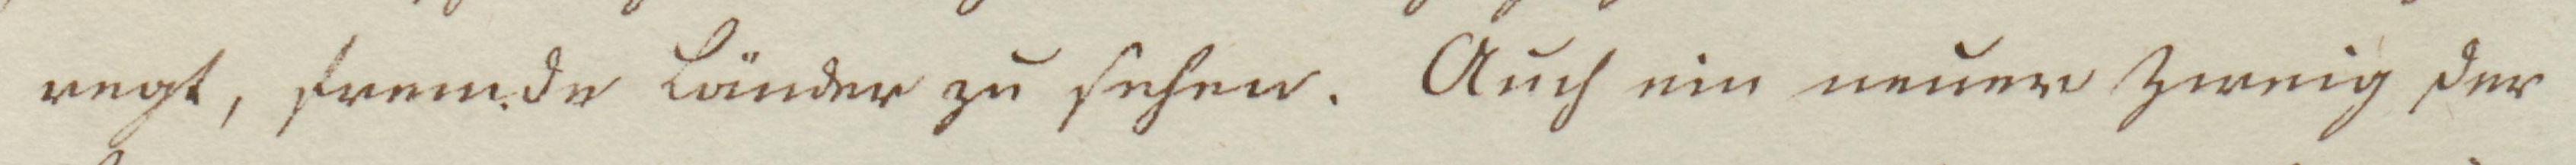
regt, fremde Länder zu sehen. Auch ein neuer Zweig der
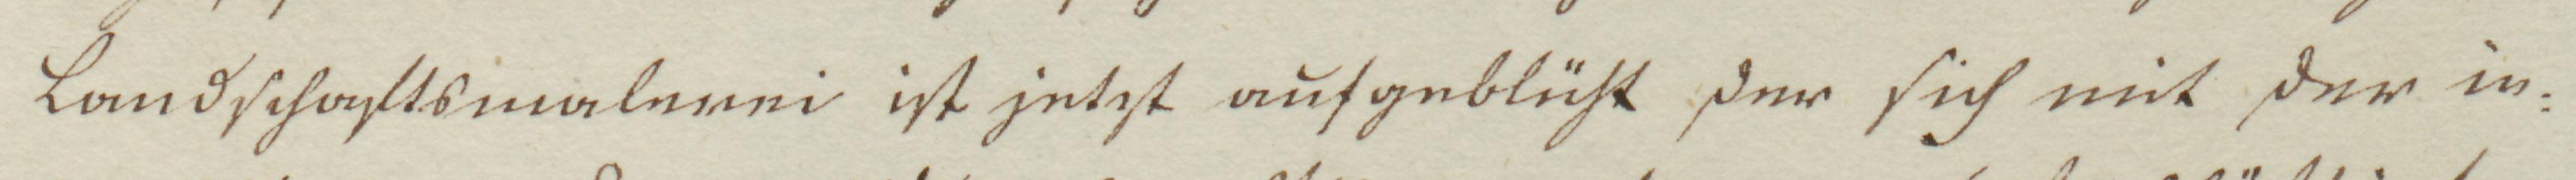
Landschaftsmalerei ist jetzt aufgeblüht der sich mit der in-
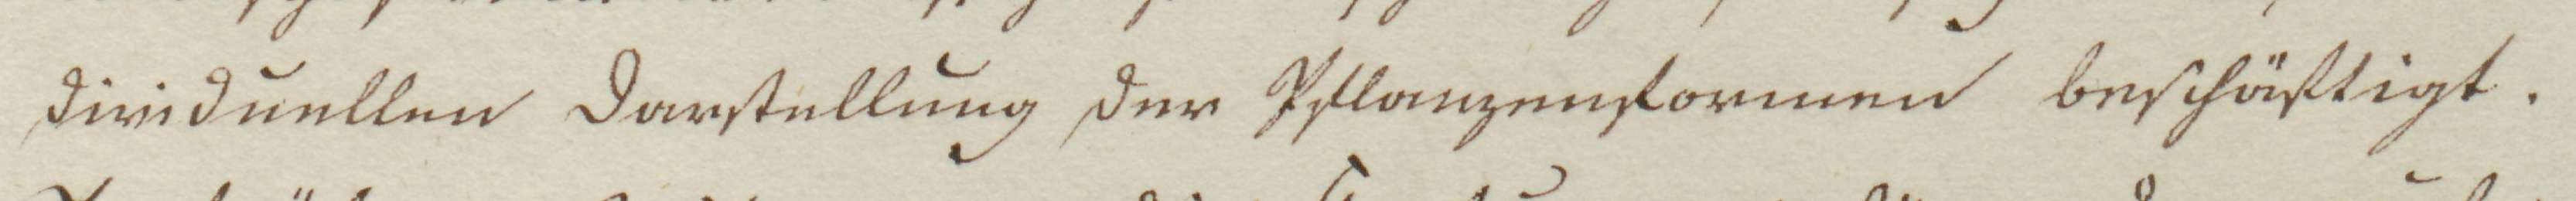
dividuellen Darstellung der Pflanzenformen beschäftigt.
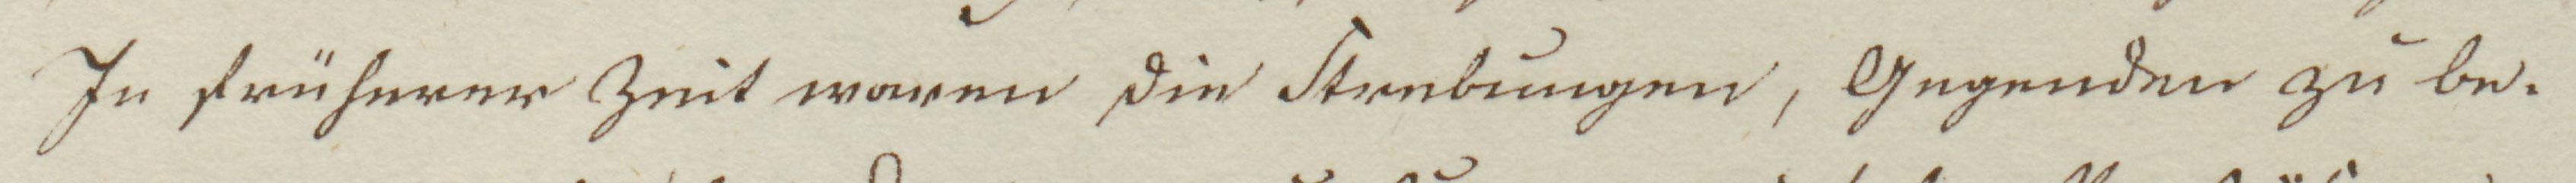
In früherer Zeit waren die Strebungen, Gegenden zu be-
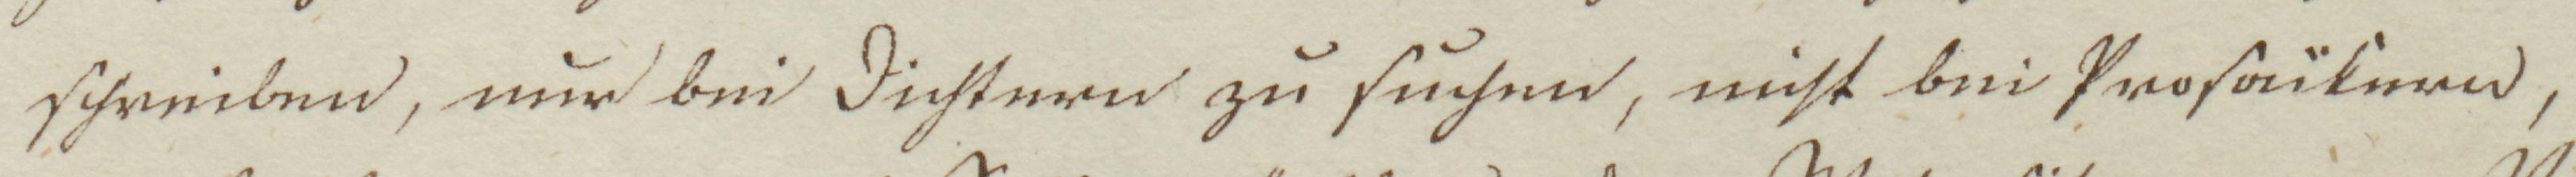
schreiben, nur bei Dichtern zu suchen, nicht bei Prosaikern,
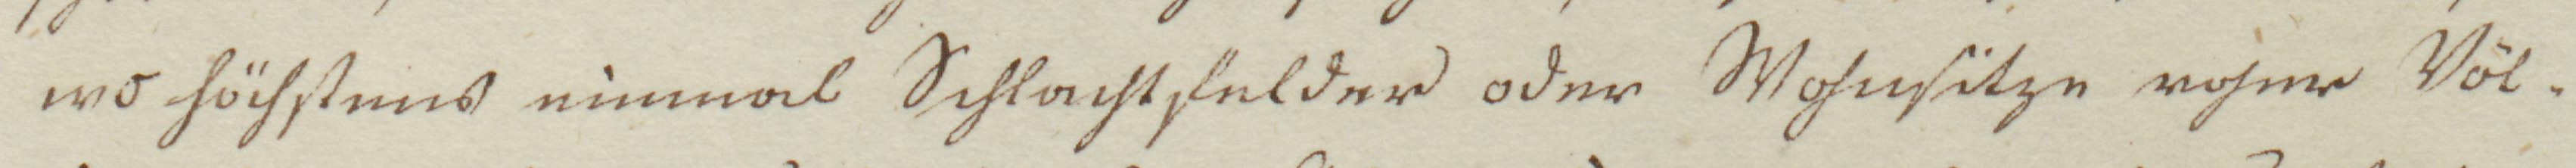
wo höchstens einmal Schlachtfelder oder Wohnsitze roher Völ-
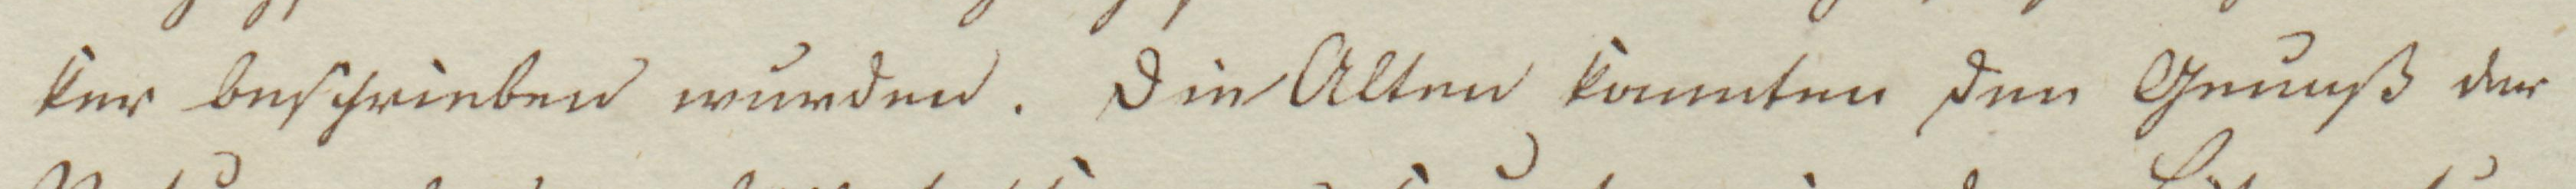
ker beschrieben wurden. Die Alten kannten den Genuß der
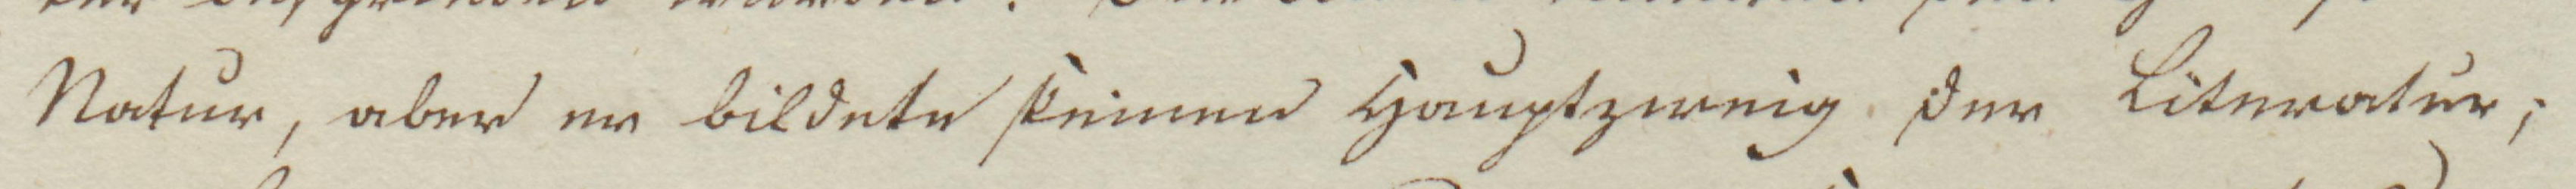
Natur, aber er bildete keinen Hauptzweig der Literatur;
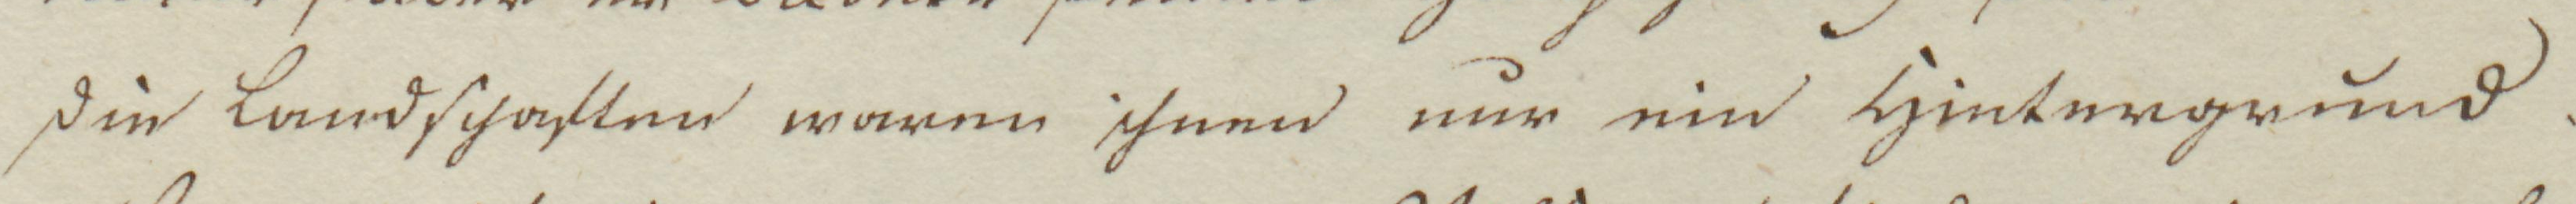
die Landschaften waren ihnen nur ein Hintergrund.
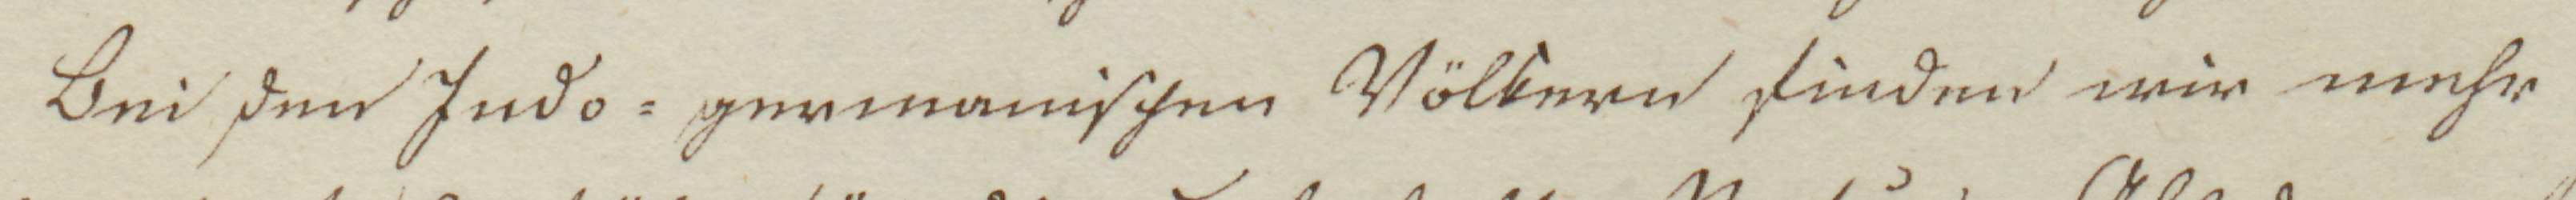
Bei den Indo-germanischen Völkern finden wir mehr
